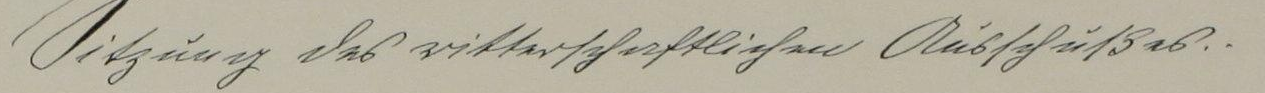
Sitzung des ritterschaftlichen Ausschußes.
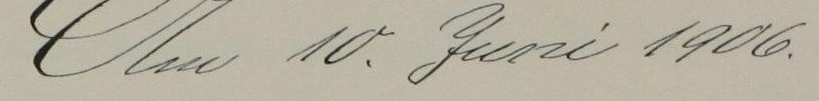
Am 10. Juni 1906.
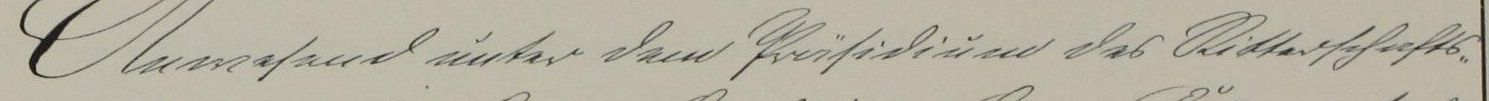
Anwesend unter dem Präsidium des Ritterschafts-
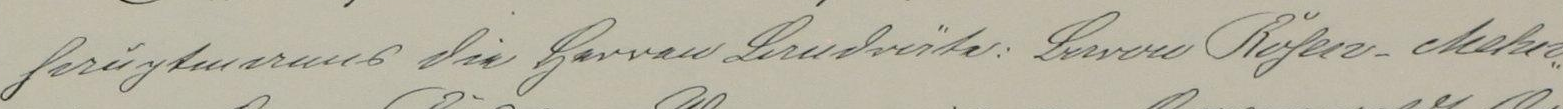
hauptmanns die Herren Landräte: Baron Rosen-Mehn-
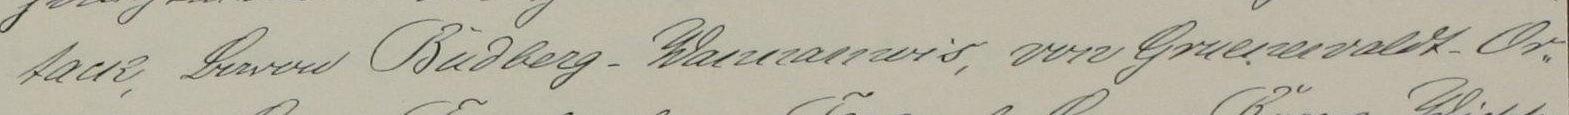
tack, Baron Budberg-Wannamois, von Gruenewaldt-Or-
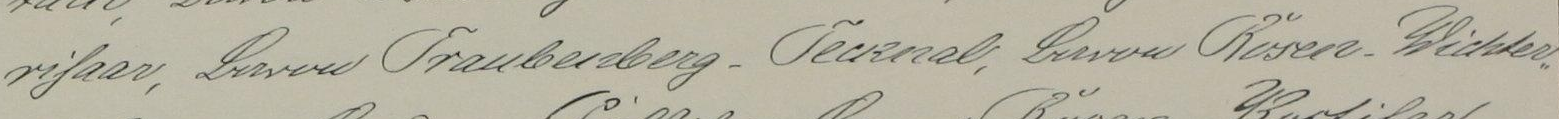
risaar, Baron Traubenberg-Tecknal, Baron Rosen-Wichter-
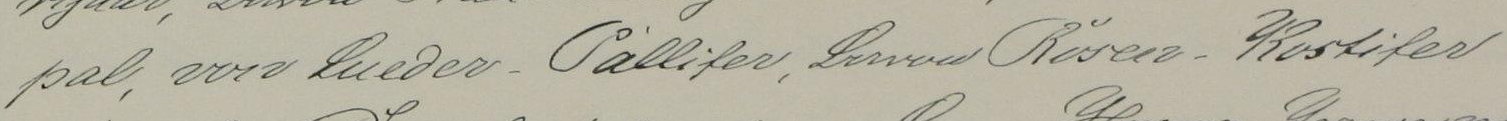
pal, von Lueder-Pallifer, Baron Rosen-Kostifer
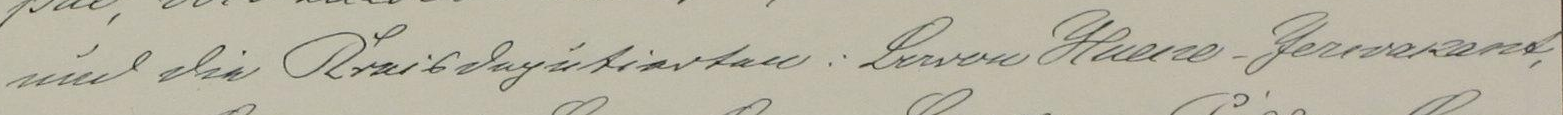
und die Kreisdeputierten: Baron Huene-Jerwakant,
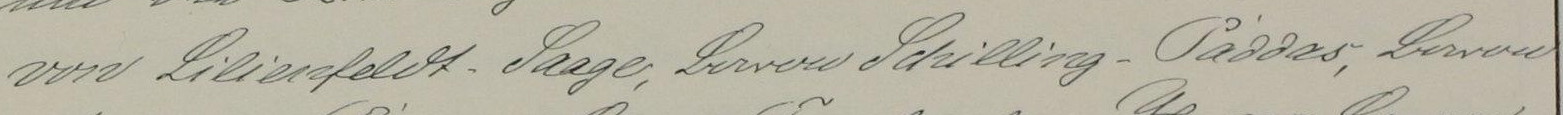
von Lilienfeldt-Saage, Baron Schilling-Paddas, Baron
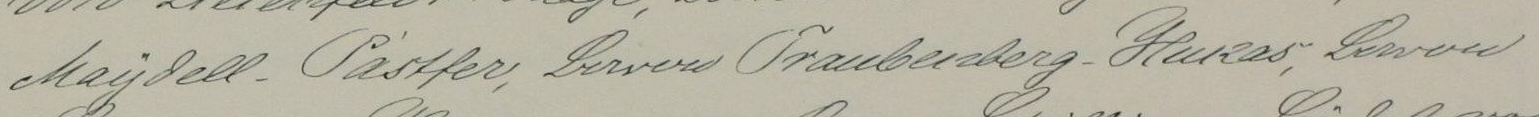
Maydell-Pastfer, Baron Traubenberg-Hukas, Baron
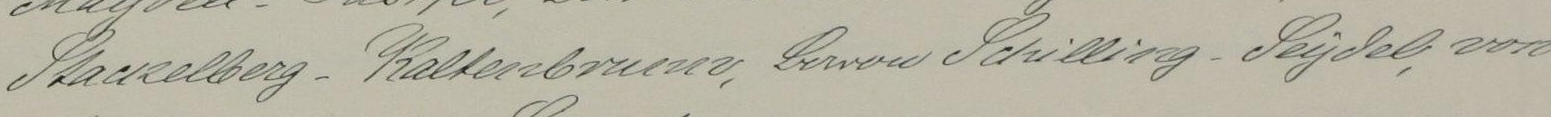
Stackelberg-Kaltenbrunn, Baron Schilling-Seydell, von
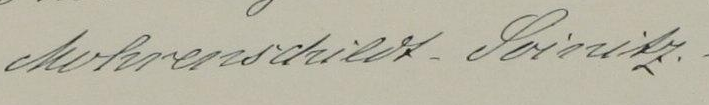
Mohrenschildt-Soinitz.
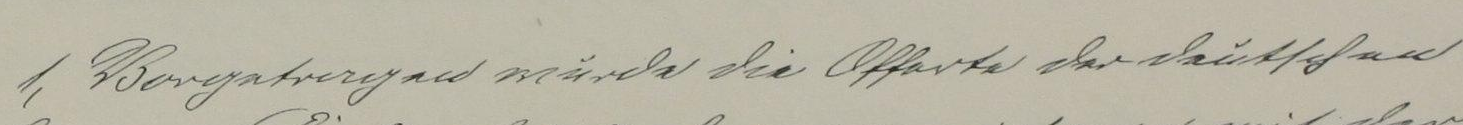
1. Vorgetragen wurde die Offerte der deutschen
